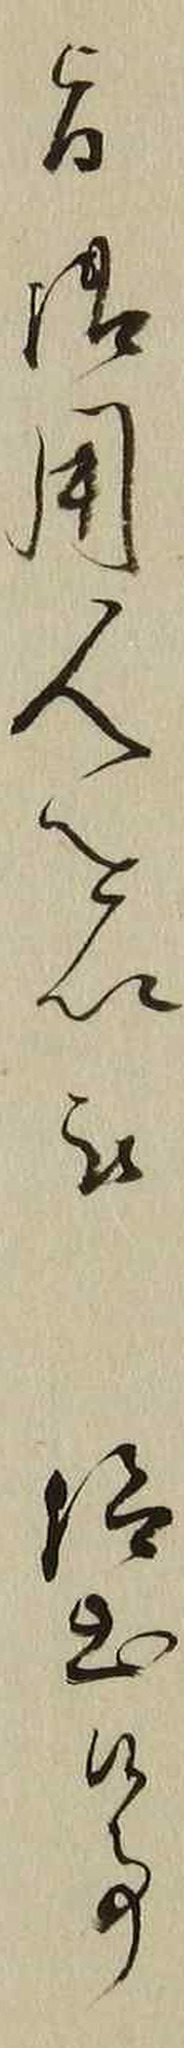旨御用人を以被仰出候事
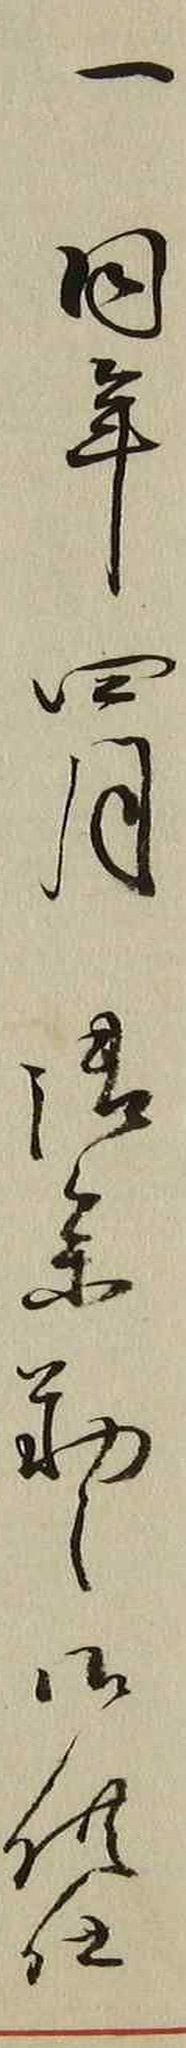一同年四月御参勤の御供仕
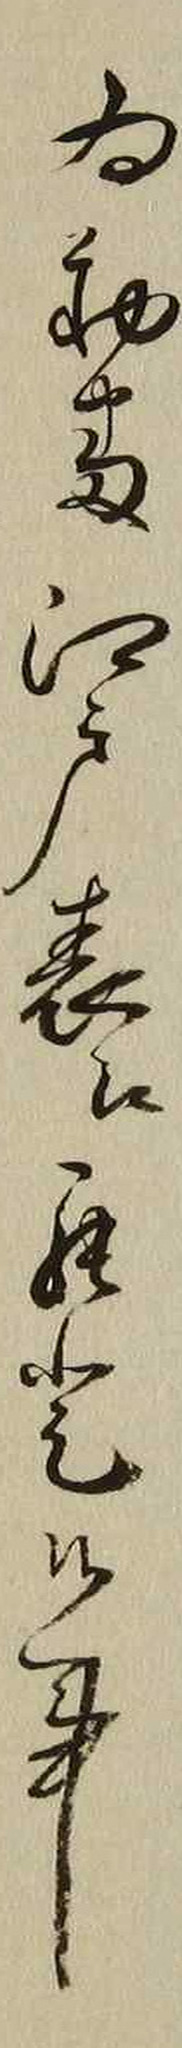為勤番江戸表江罷登候事
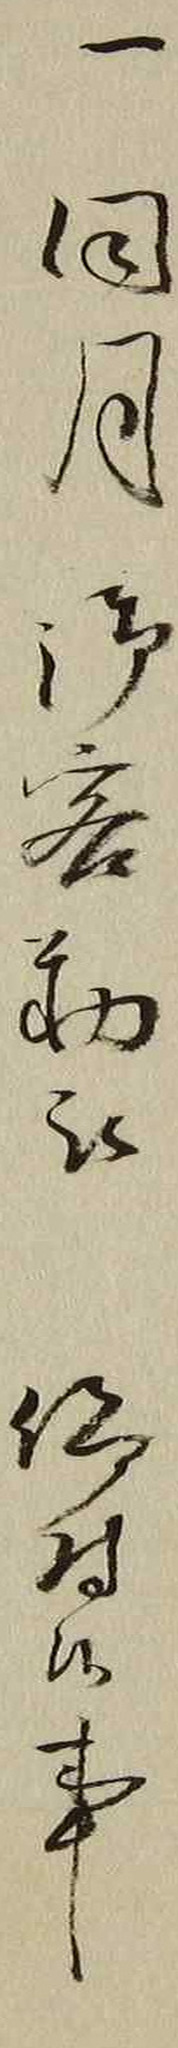一同月御客勤被仰付候事
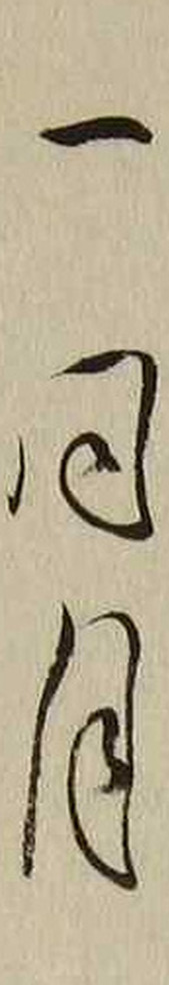一同月
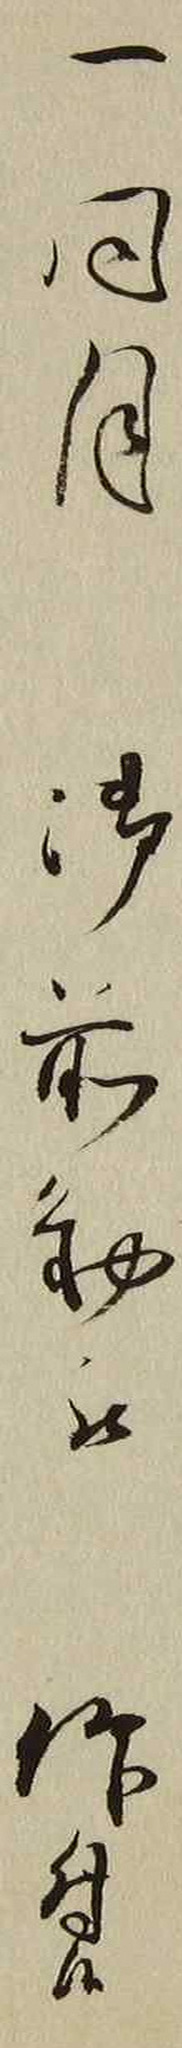一同月御前勤被仰付候
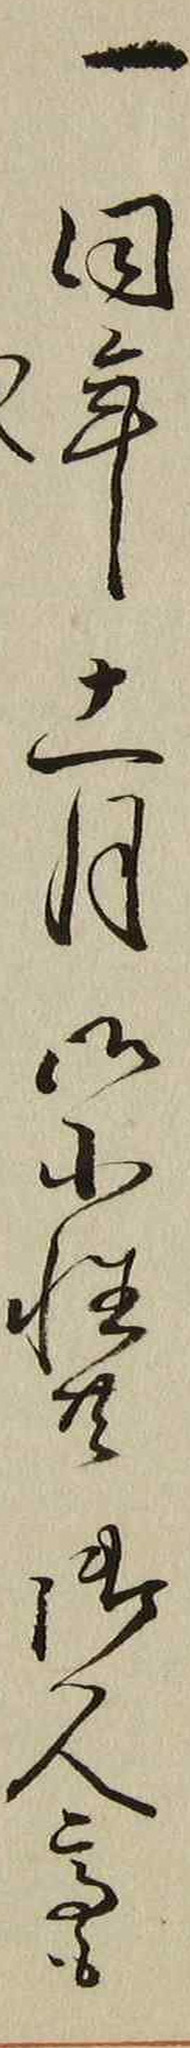一同年十一月御小姓共御人高も
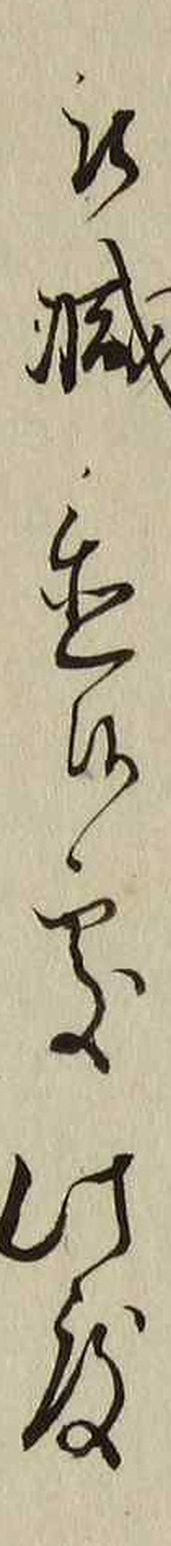被減置候処此度
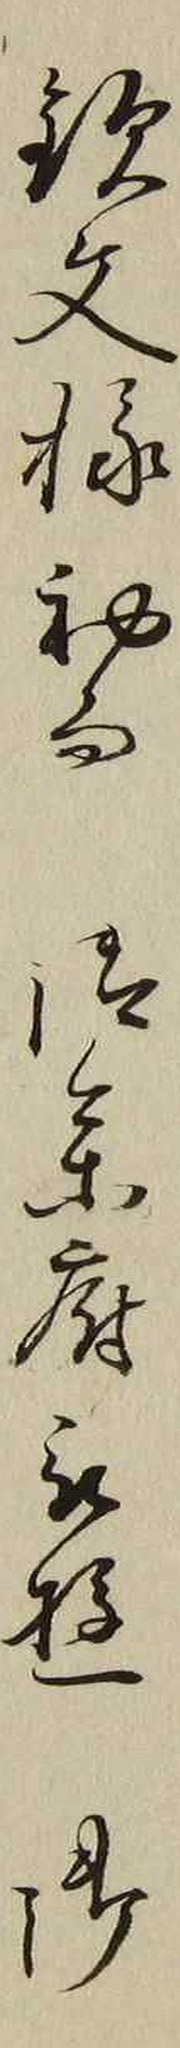欽文様初而御参府被遊御
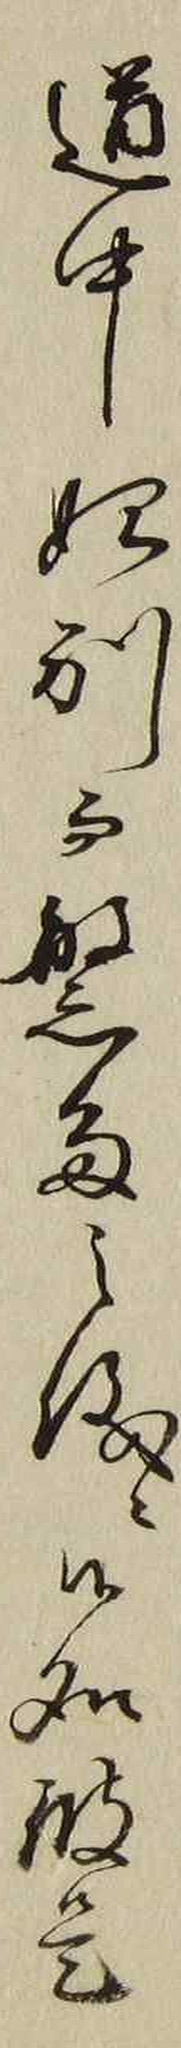道中始別而繁多の儀に候処彼是
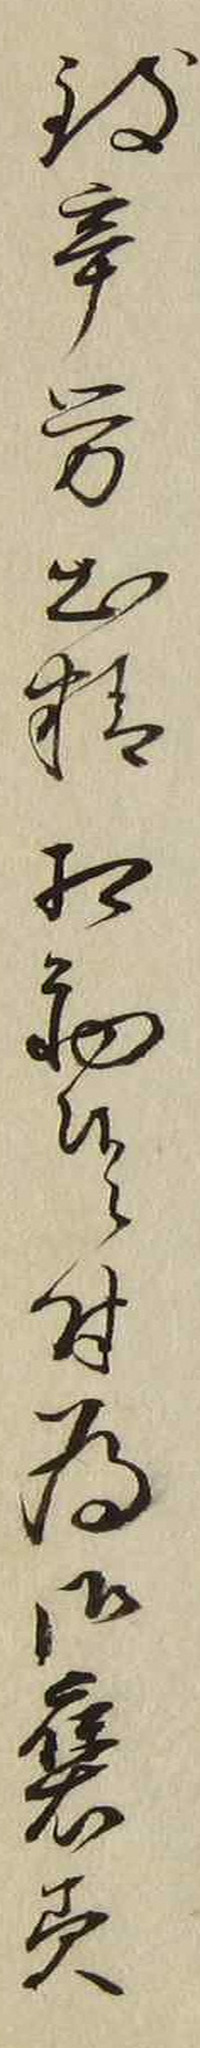致辛労出精相勤候に付為御褒美

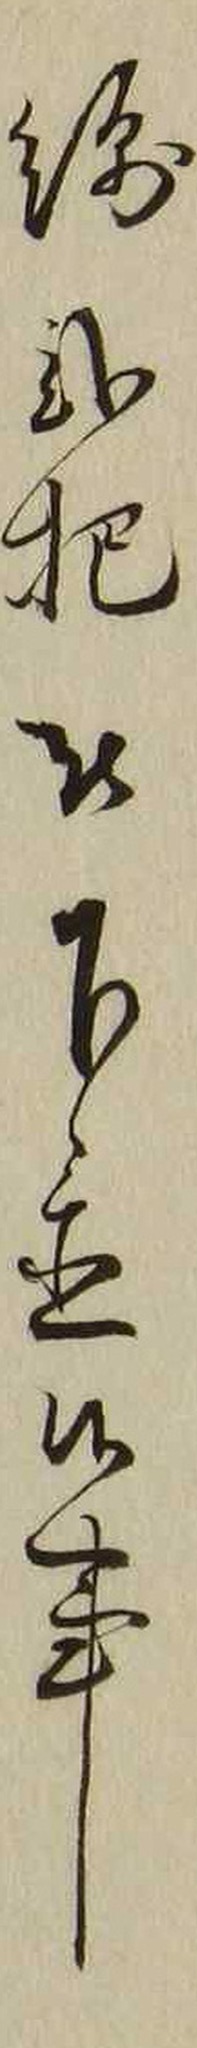綿弐把被下置候事
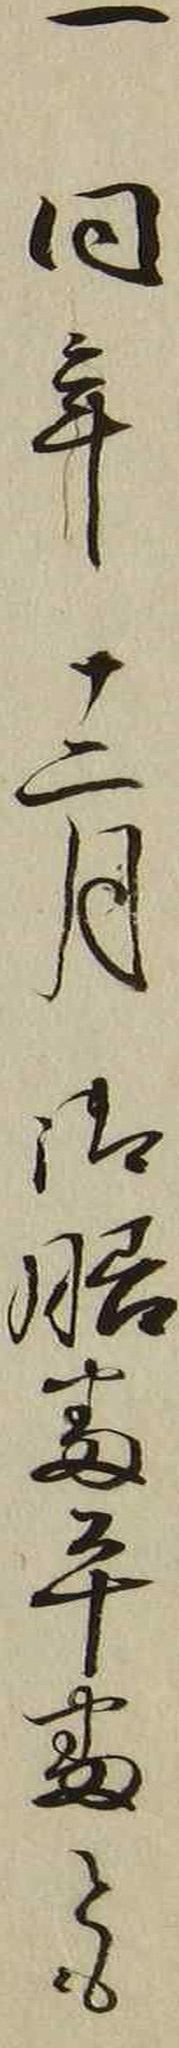一同年十二月御膳番平番とも
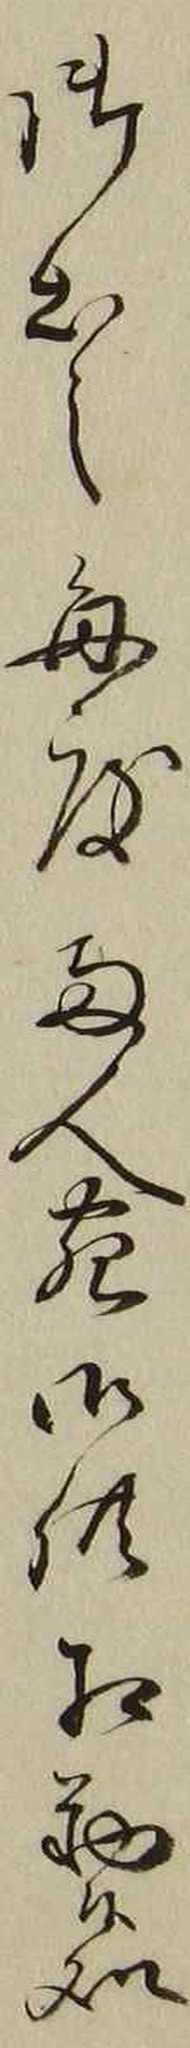御出の毎度両人宛御供相勤候処
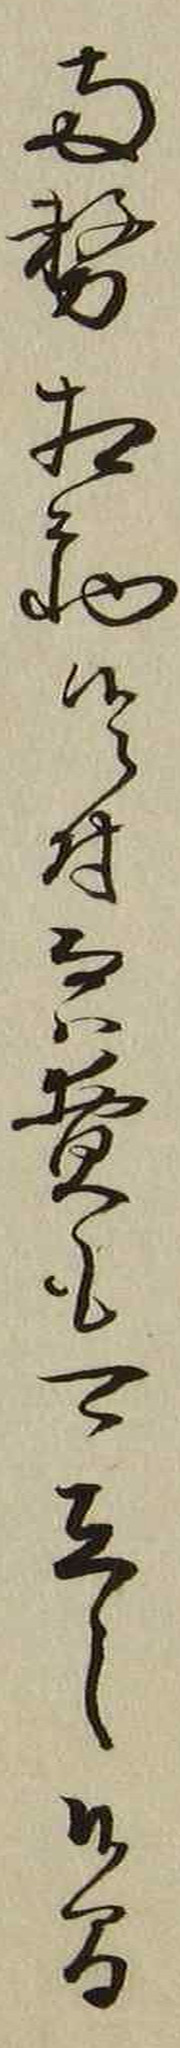両務相勤候に付而は費も可在之候間
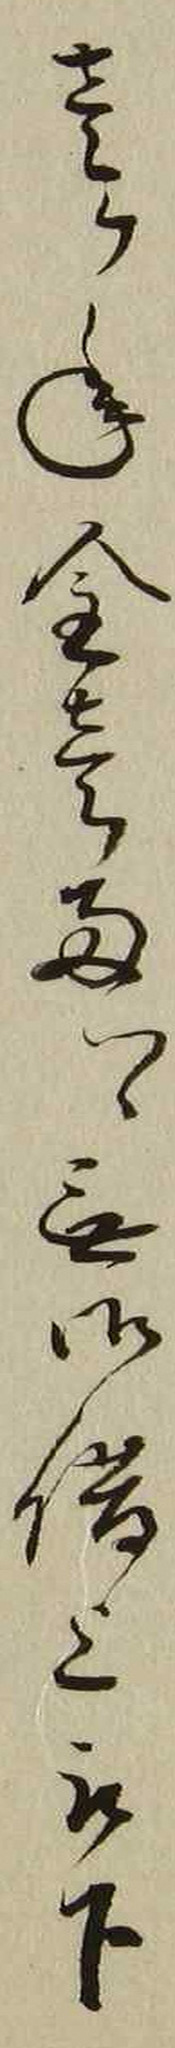壱ケ年金壱両ツヽ無御借上被下
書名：諸士系譜　巻之1　い之部1
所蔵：会津若松市立会津図書館
